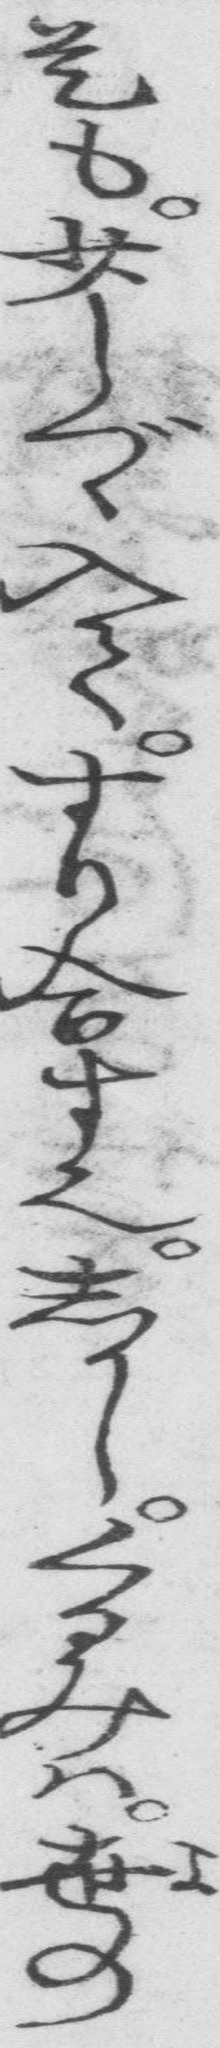是も。少しづゝ入て。すり合す也。しかし。くるみは。世の
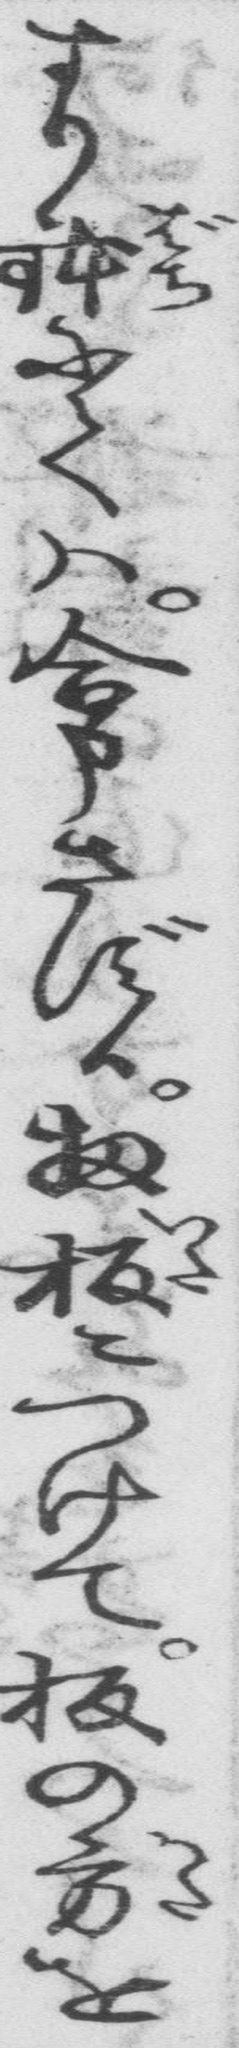すり鉢にては。合申さず候。扨板につけて。板の方を
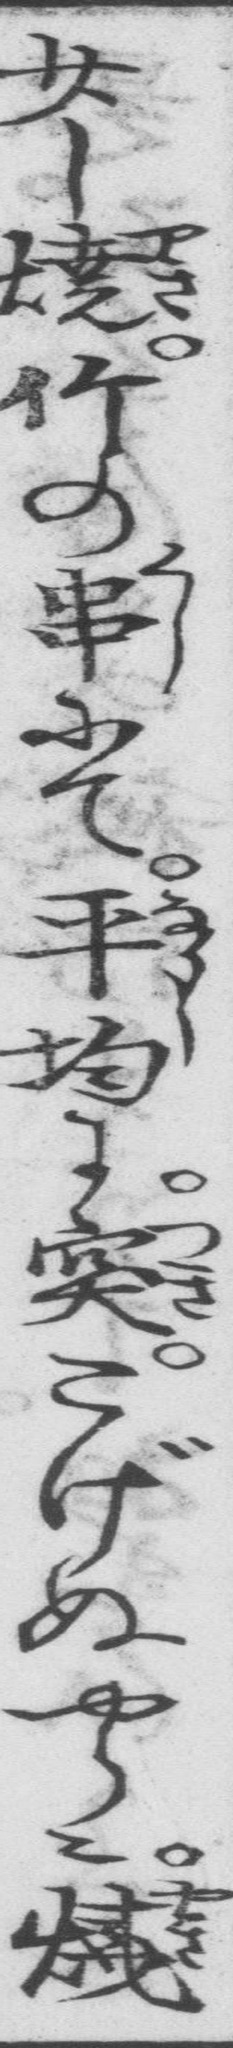少し焼。竹の串にて。平均に。突。こげぬやうに。焼
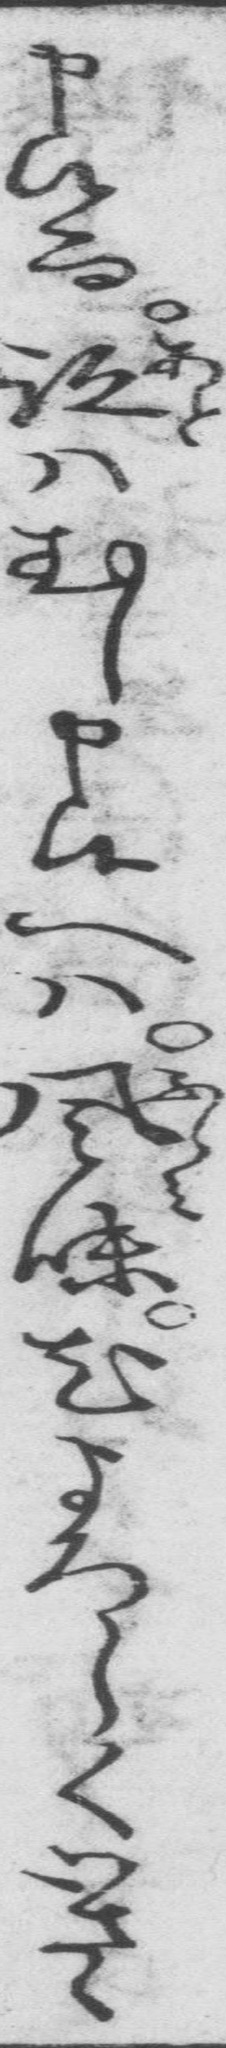申候而。跡はむし申候へは。風味。尤よろしく御さ候
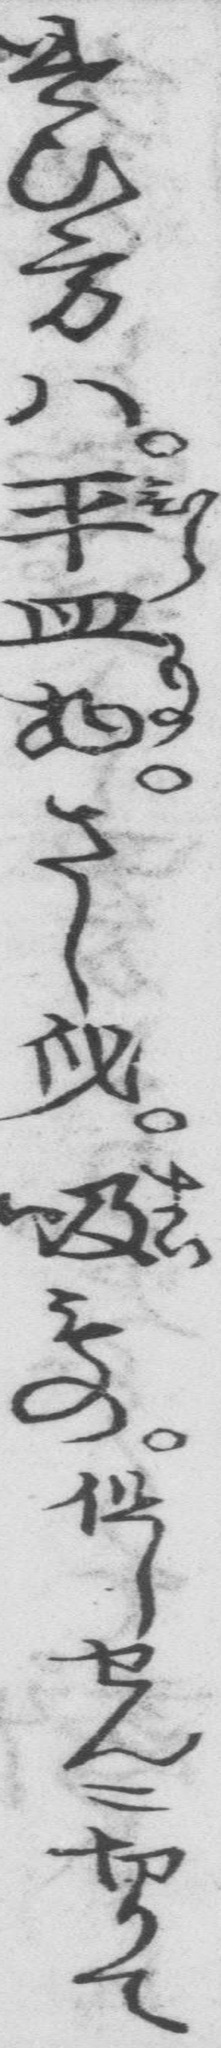遣ひ方は。平皿物。さし身。吸もの。但しせんに切りて
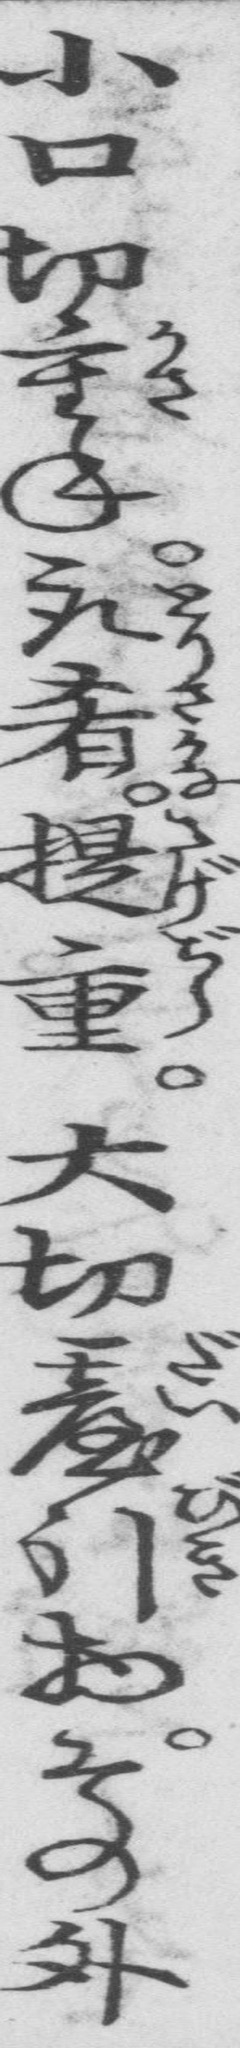小口切重ね。取肴。提重。大切台引物。その外
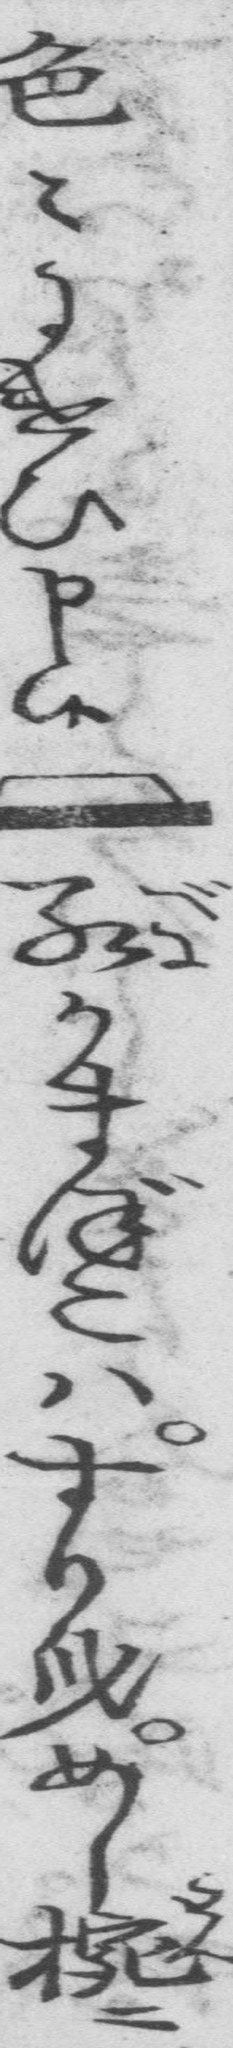色々に遣ひ申候紅かまぼこは。すり身。めし椀に

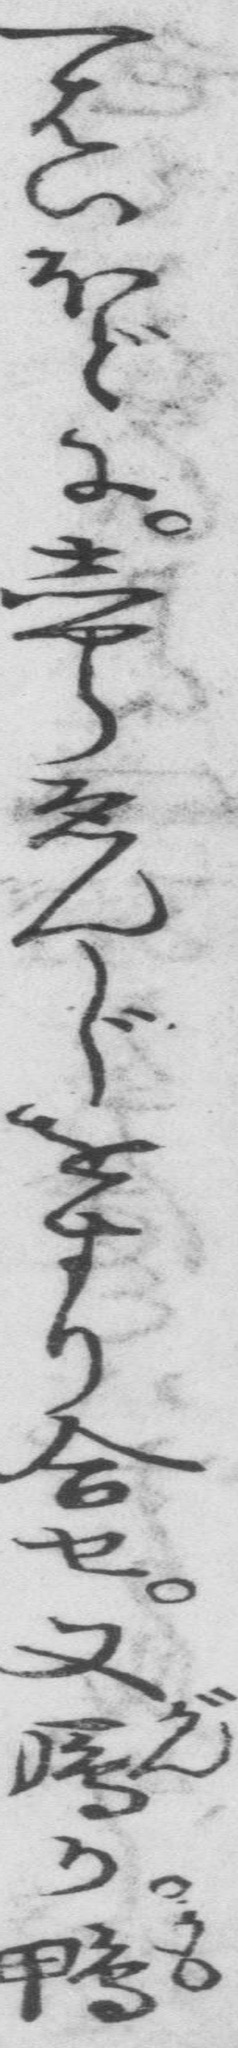一はいほどに。しやうゑんじをすり合せ。又雁か。鴨
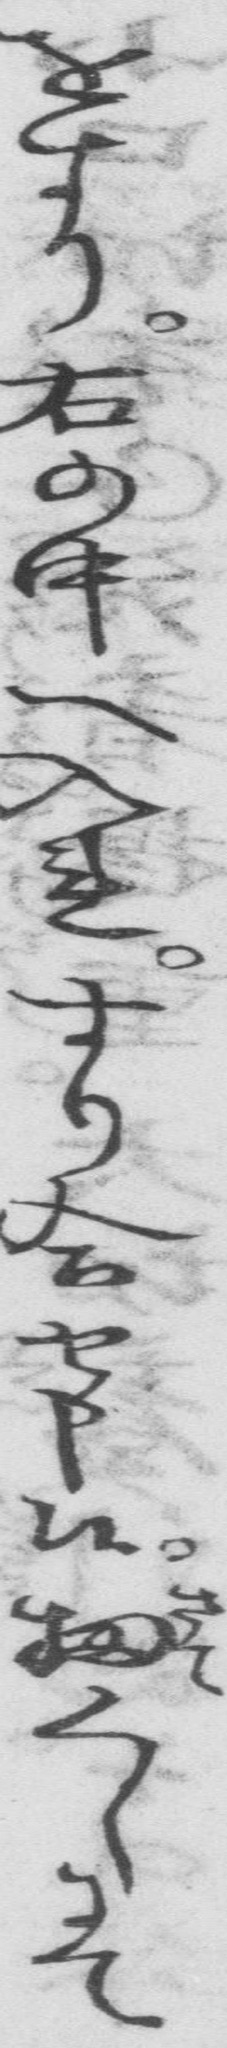をすり。右の中へ入れ。すり合せ申候。扨くしにて
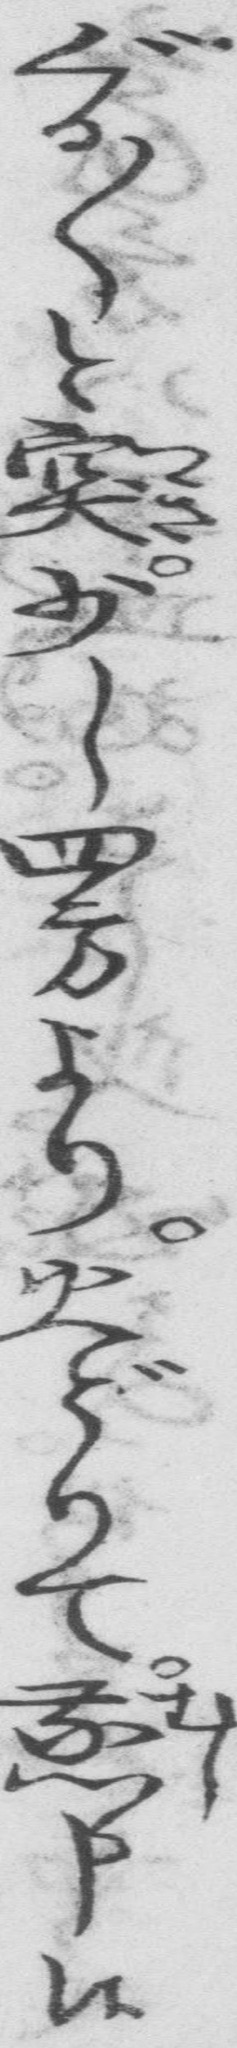ぐる〳〵と突。少し四方より。火どりて。蒸申候
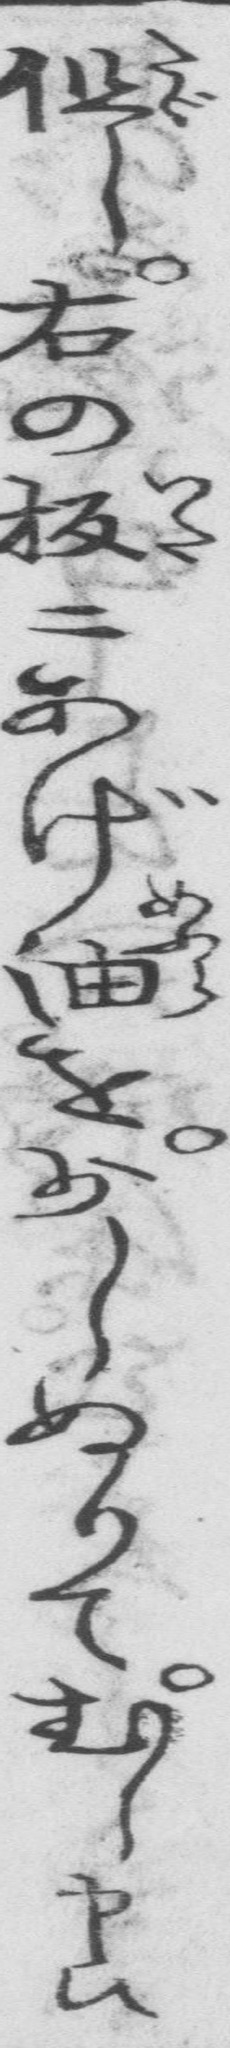但し。右の板にあげ油を。少しぬりて。むし申候
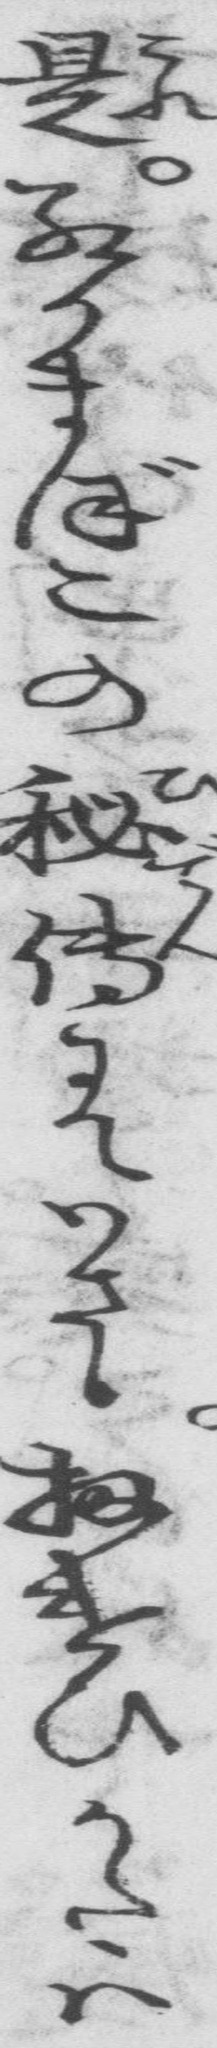是。紅かまぼこの秘伝にて御さ候。扨遣ひかたは
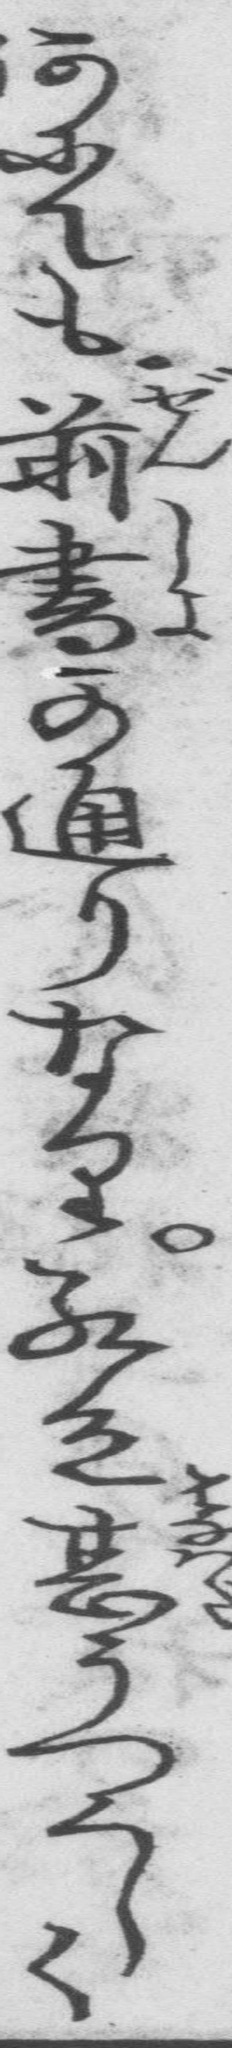何にても。前書の通りなり。紅色甚うつくしく
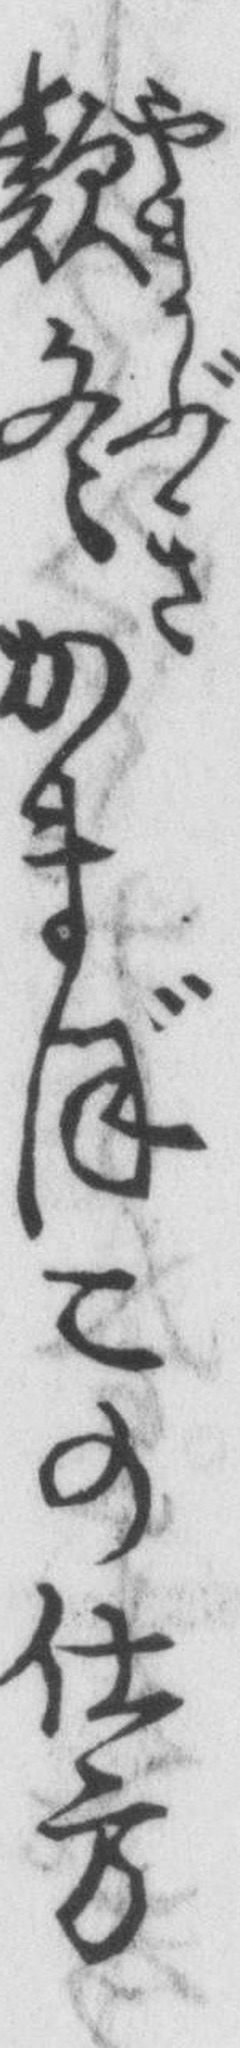款冬かまぼこの仕方
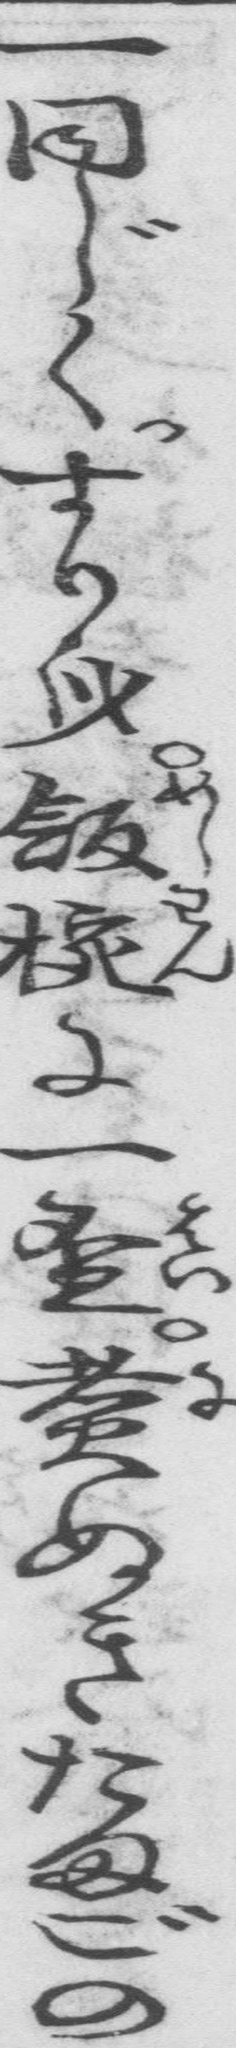一同じく。すり身。飯椀に一盃。煮ぬきたまごの
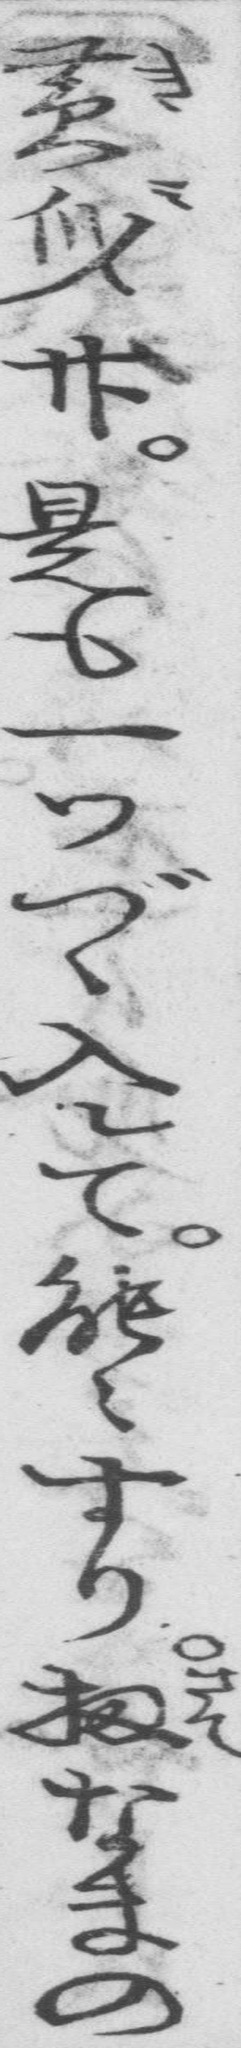黄身廿。是も一ツづゝ入れて。能々すり。扨なまの
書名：萬寳料理秘密箱
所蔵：大阪府立大学学術情報センター 国文学研究資料館
